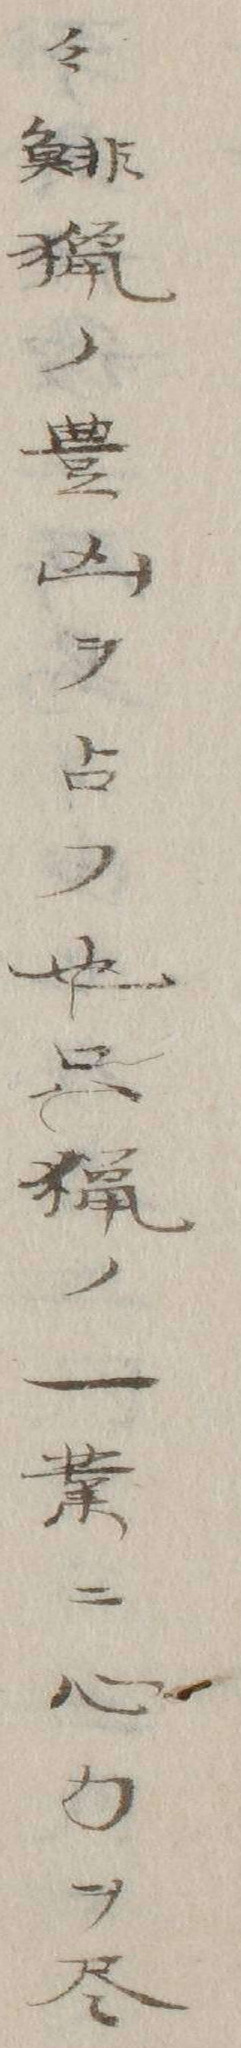々鯡猟ノ豊凶ヲ占フ也只猟ノ一業ニ心力ヲ尽
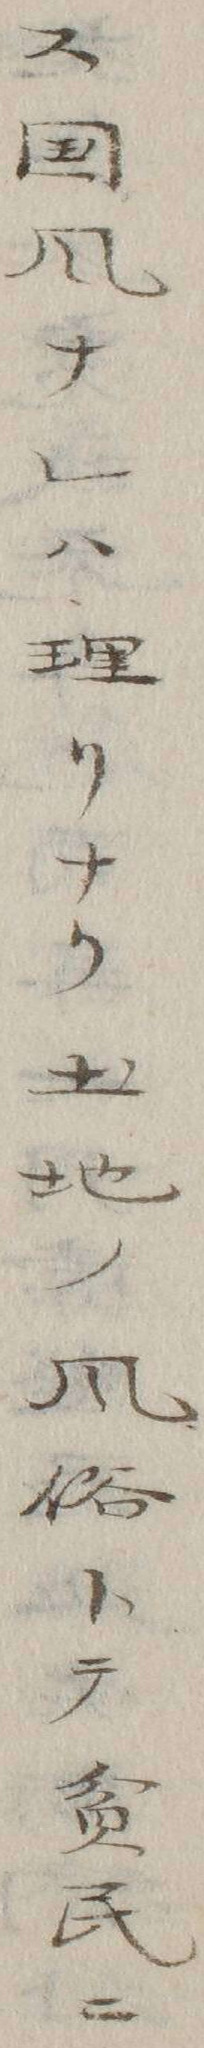ス国風ナレハ理リナリ土地ノ風俗トテ貧民ニ
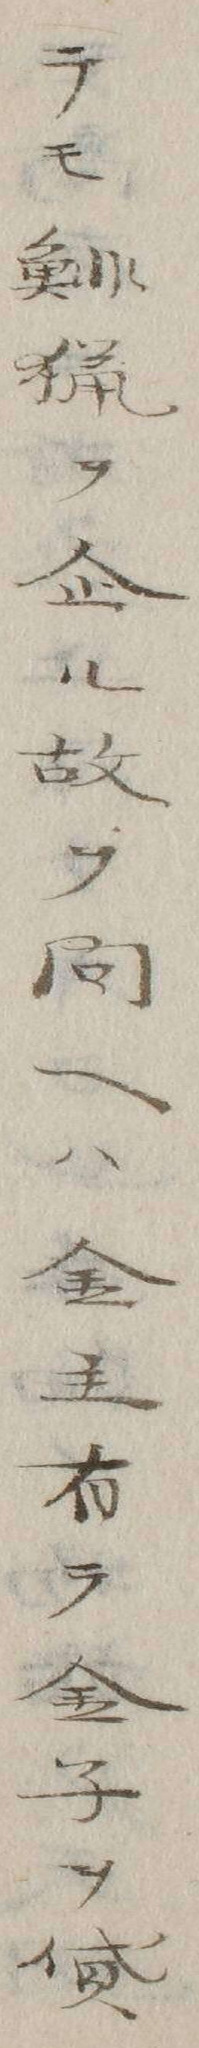テモ鯡猟ヲ企ル故ヲ問ヘハ金主有テ金子ヲ貸
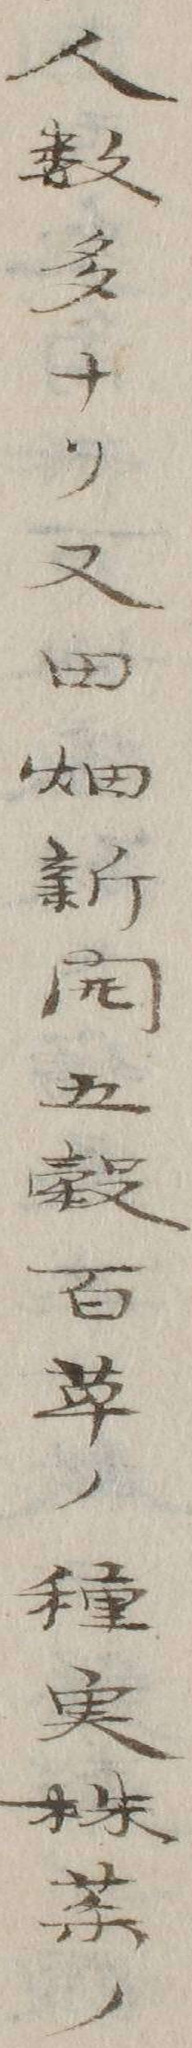人数多ナリ又田畑新開五穀百草ノ種実株茶ノ
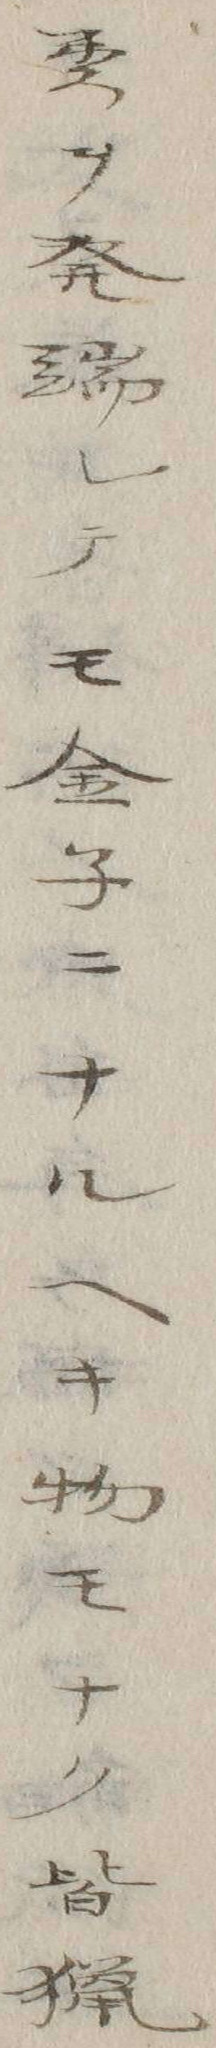類ヲ発端シテモ金子ニナルヘキ物モナク皆猟
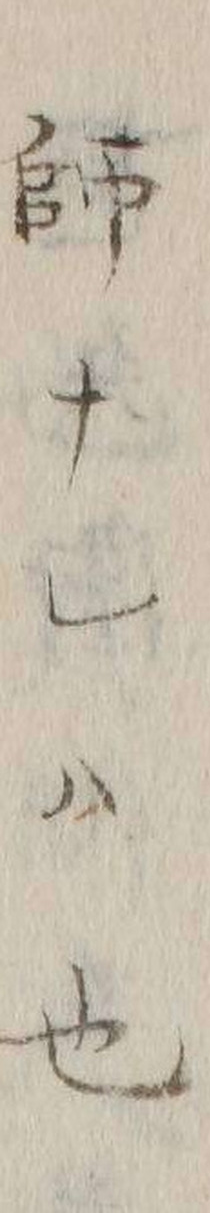師ナレハ也
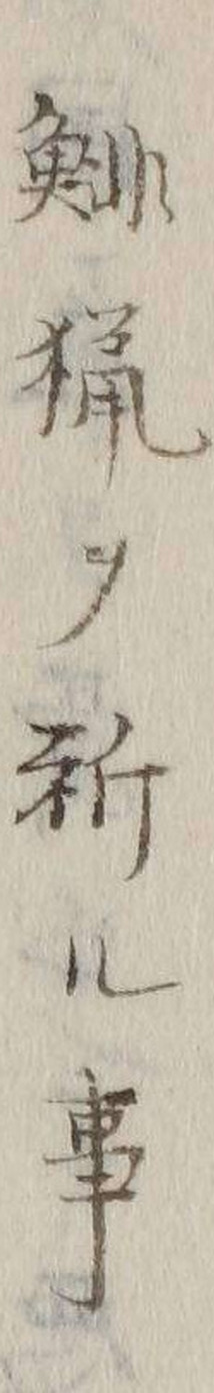鯡猟ヲ祈ル事
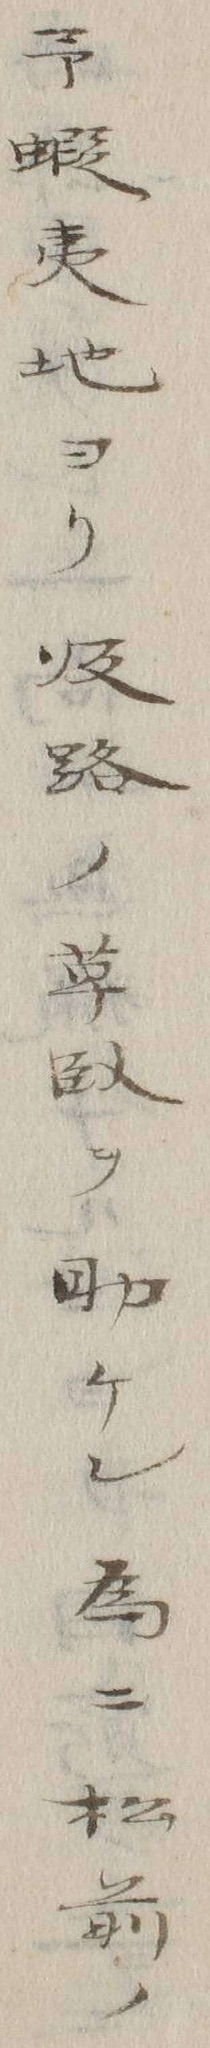予蝦夷地ヨリ帰路ノ草臥ヲ助ケン為ニ松前ノ
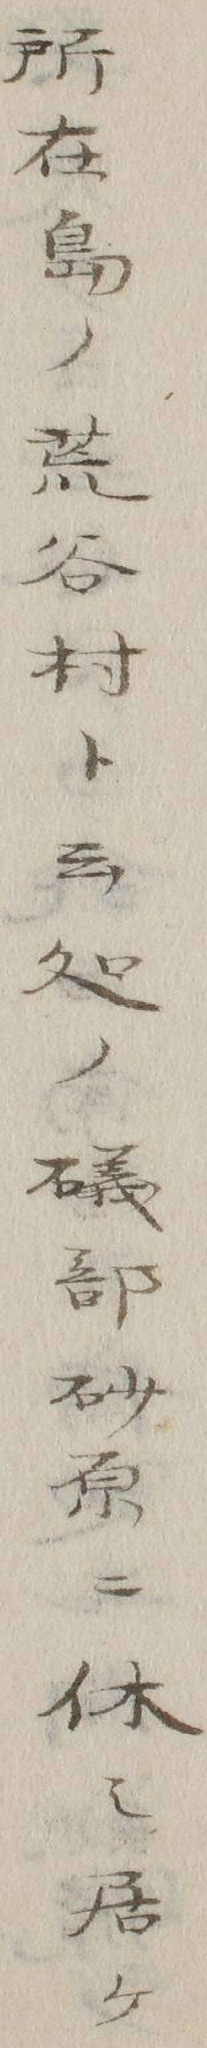所在島ノ荒谷村ト云処ノ磯部砂原ニ休ミ居ケ
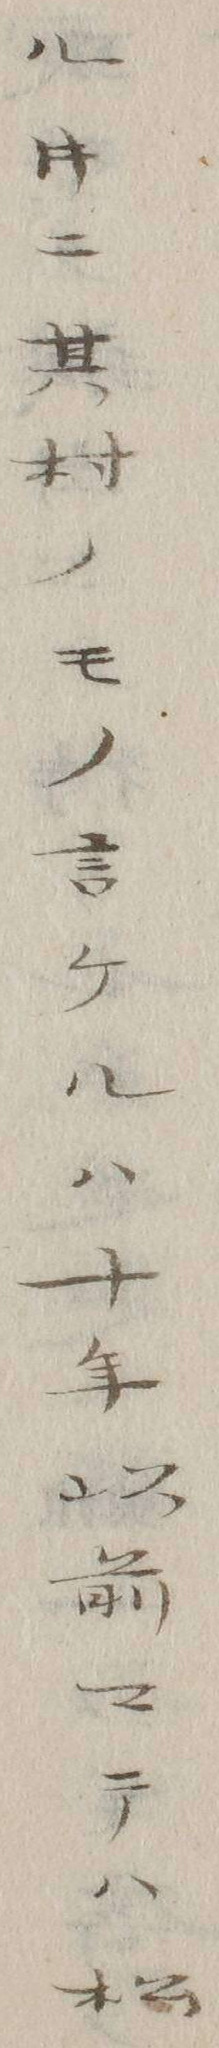ルトキニ其村ノモノ言ケルハ十年以前マテハ松
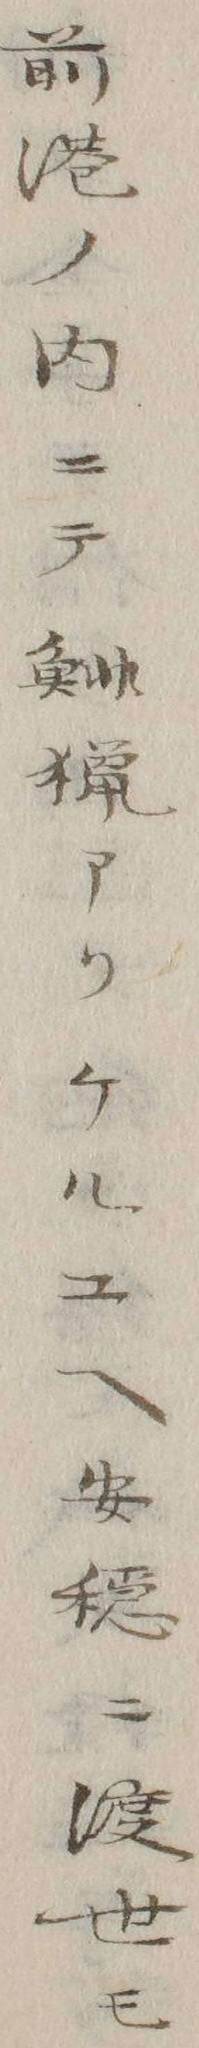前港ノ内ニテ鯡猟アリケルユヘ安穏ニ渡世モ
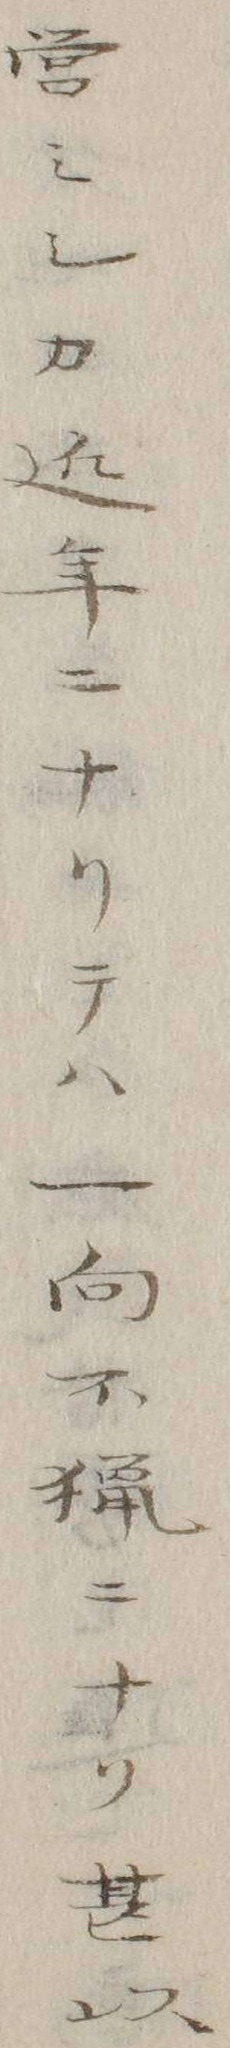営ミシカ近年ニナリテハ一向不猟ニナリ甚以
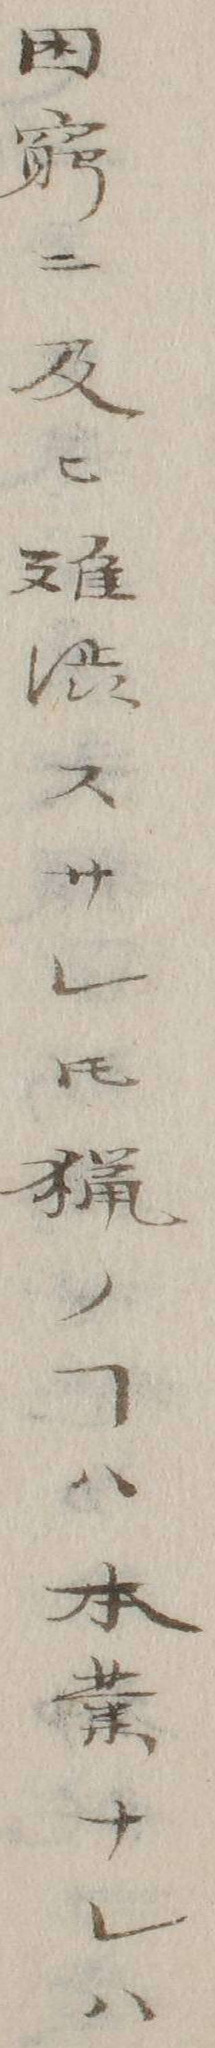困窮ニ及ヒ難渋スサレ𪜈猟ノヿハ本業ナレハ
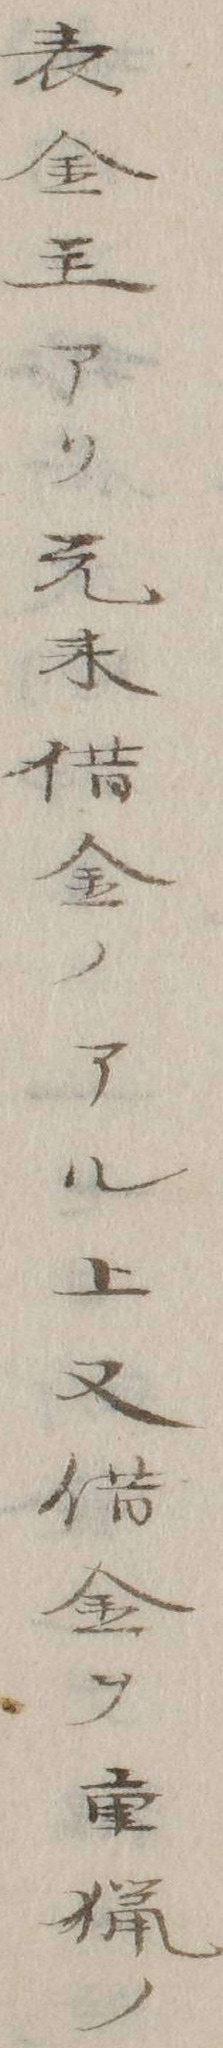表金主アリ元来借金ノアル上又借金ヲ重猟ノ
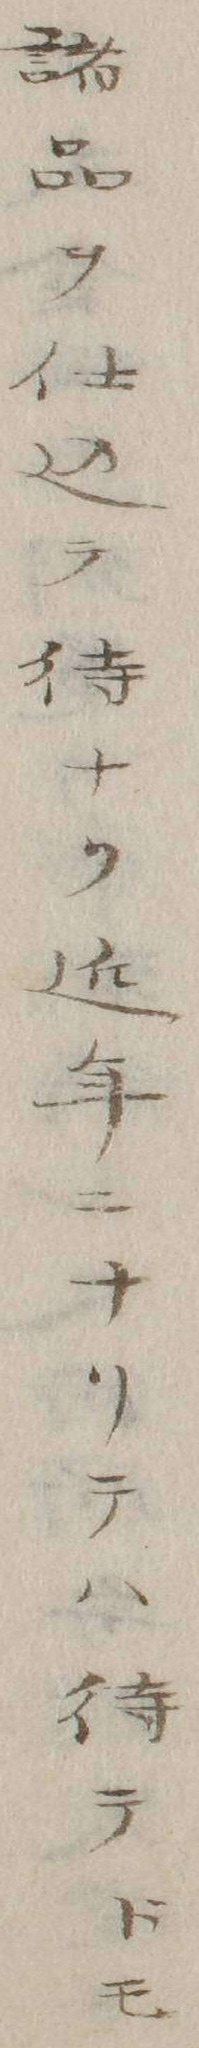諸品ヲ仕込ヲ待ナリ近年ニナリテハ待テドモ
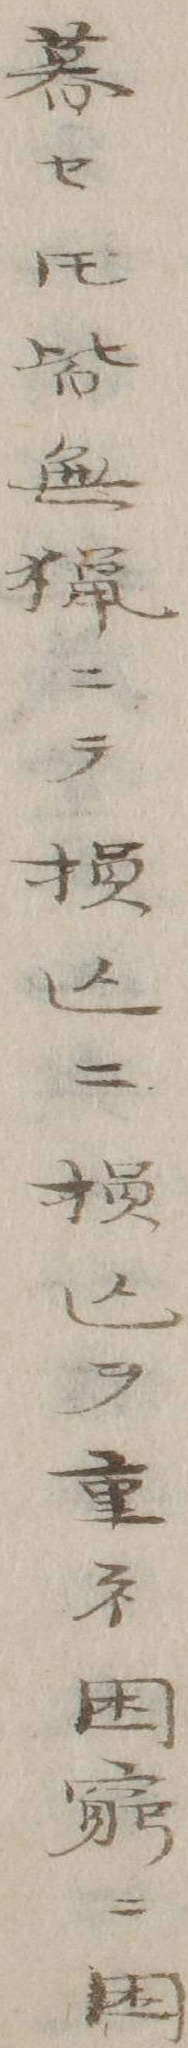暮セ𪜈皆無猟ニテ損凶ニ損凶ヲ重ネ困窮ニ困
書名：蝦夷草紙（国文学研究資料館）
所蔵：国文学研究資料館
